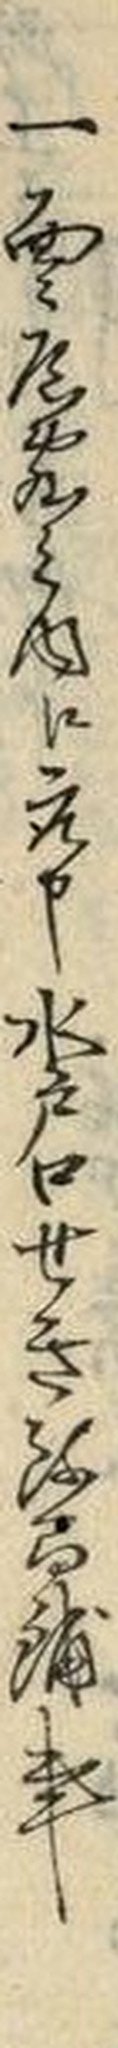一面々屋敷之内え取申水戸口せき致間鋪事
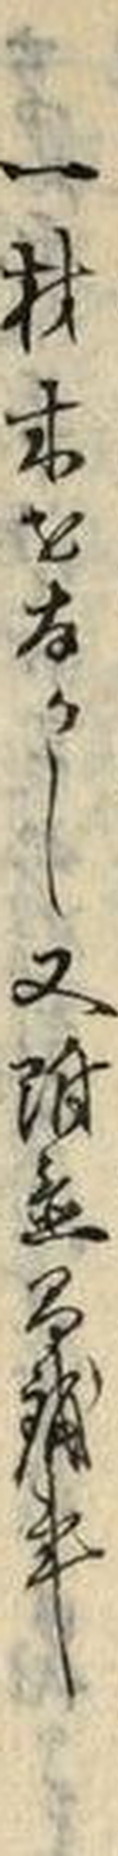一材木をなかし又附置間鋪事
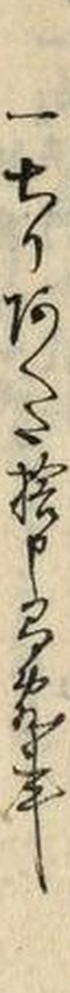一ちりあくた捨申間敷事
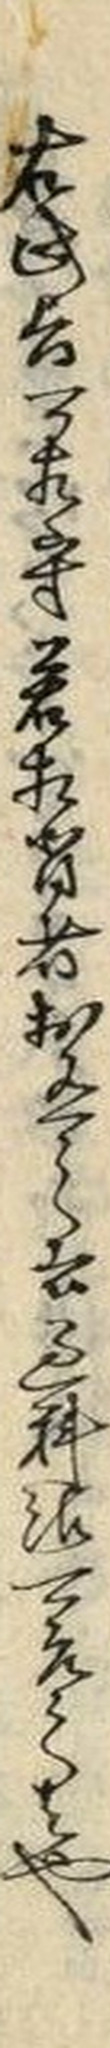右此旨可相守若相背者於有之者過料銀可取之者也
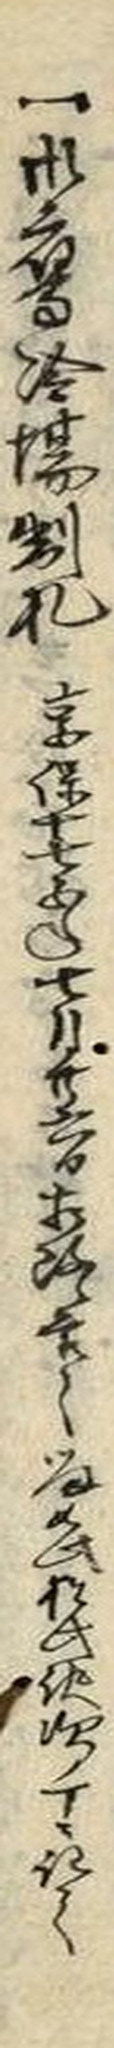一御鷹冷場制札享保十七子年七月廿六日相改候節之留如此猶此訳次ノ丁に記之
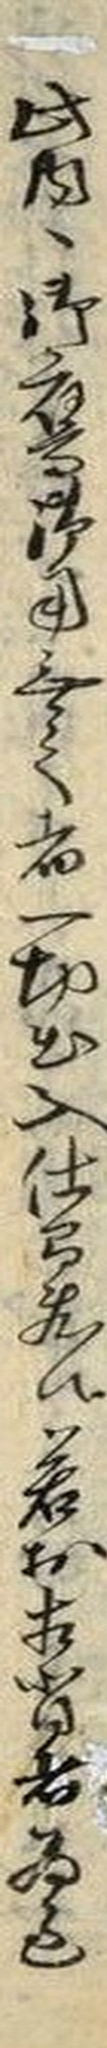此内へ御鷹御用無之者一切出入仕間敷候若於相背者為過
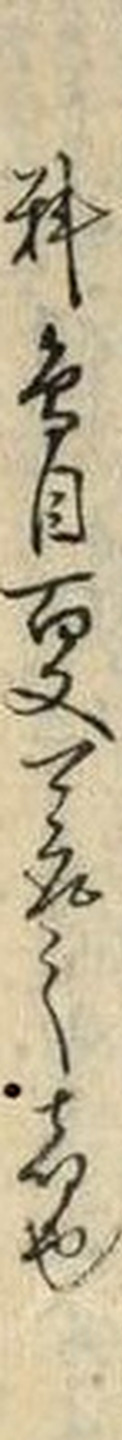料鳥目百文可取之者也

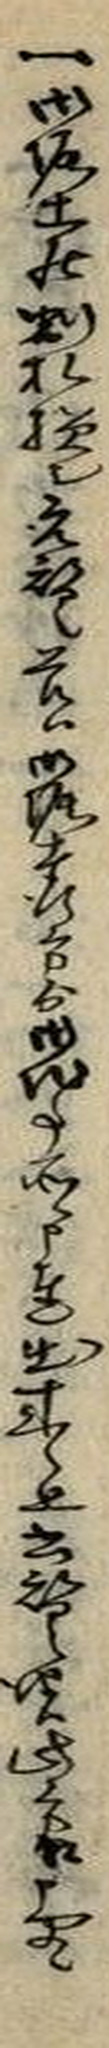一御堀土居制札損シ取替候節は御堀奉行方ゟ御作事所へ申達出来候上書替之儀は此方え申聞候
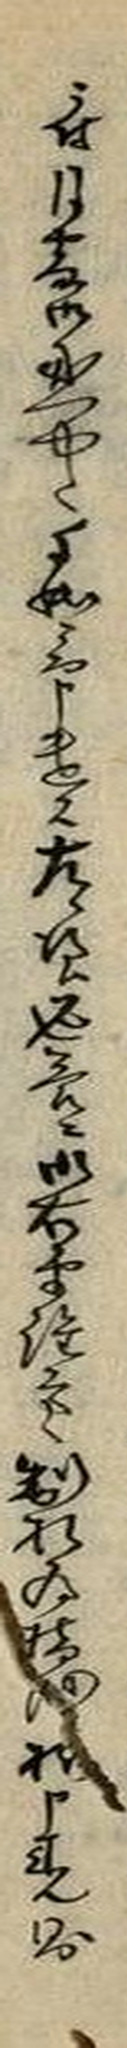に付月番御用人中へ手紙にて申遣ス左候得は返答に御右筆誰方へ制札為指越候様申来ル則
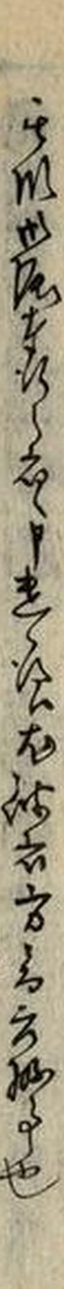其段御堀奉行之者へ申遣候得は尤彼者方にて取扱事也
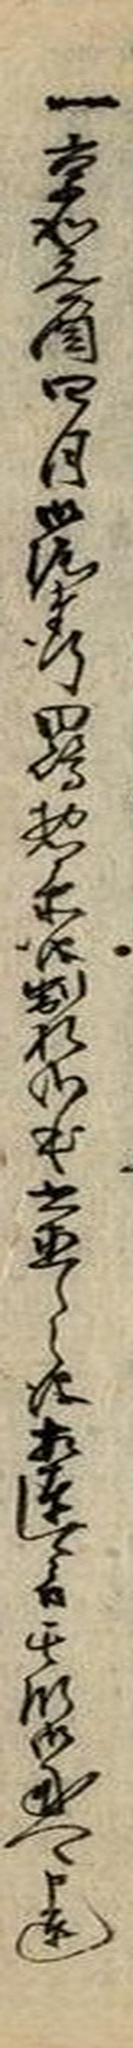一享和元酉四月御堀奉行田島惣兵衛儀制札弐本書直し之儀相達候に付其段御用人へ申達
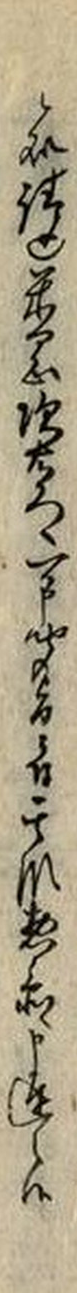候処請込米岡次右衛門へ可申聞旨に付其段惣兵衛へ申達之候
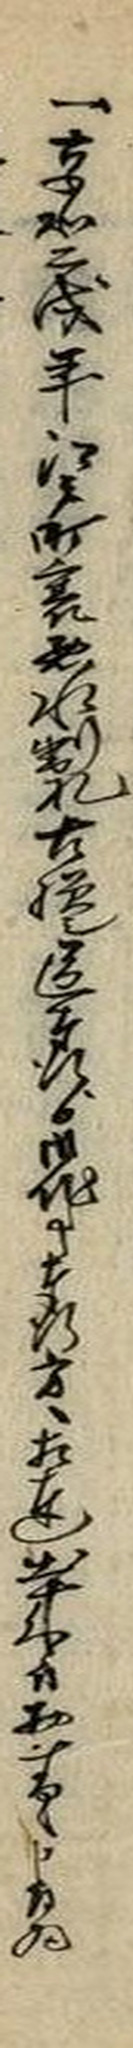一享和二戌年江戸町裏悪水制札古損シ道奉行ゟ御作事奉行方へ相達出来候付物書へ申付為
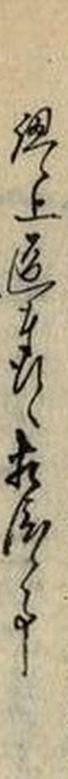認候上道奉行へ相渡候事
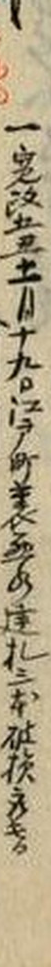一寛政五丑十一月十九日江戸町裏悪水建札三本破損取替
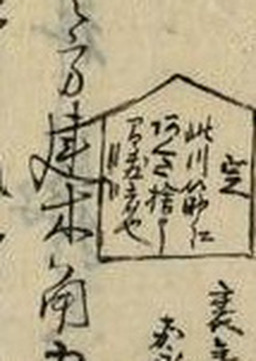間敷者也
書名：御城下諸事之部
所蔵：福井県文書館 Fukui Prefectural Archives
